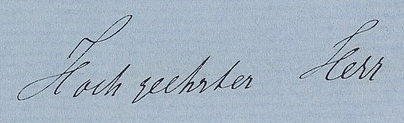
Hochgeehrter Herr
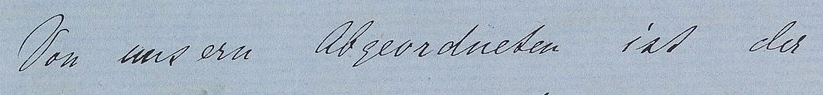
Von unsern Abgeordneten ist der
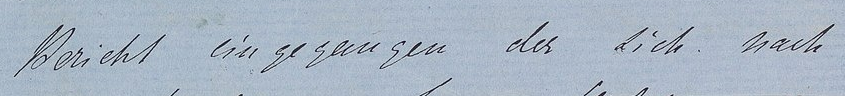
Bericht eingegangen der sich nach
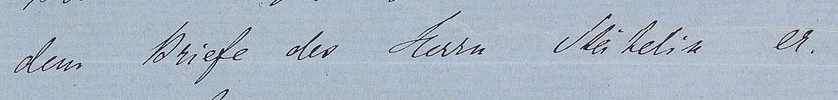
dem Briefe des Herrn Stähelin er-
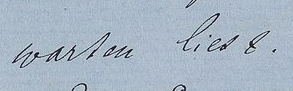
warten liess.
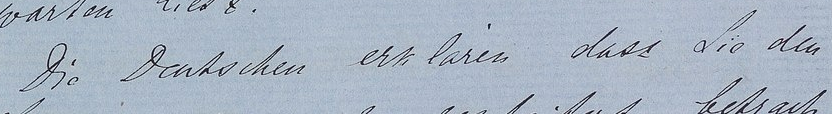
Die Deutschen erklären dass Sie den
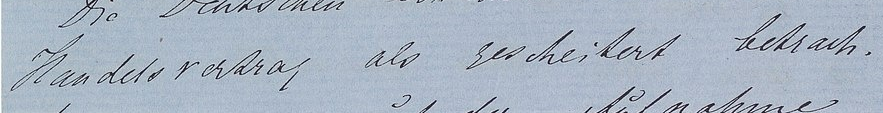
Handelsvertrag als gescheitert betrach-
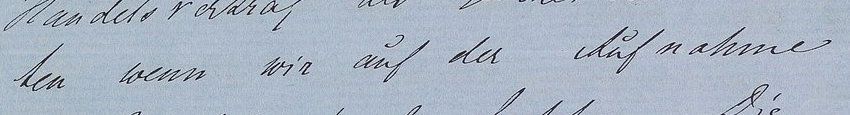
ten wenn wir auf der Aufnahme
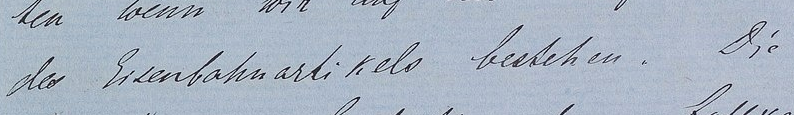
des Eisenbahnartikels bestehen. Die
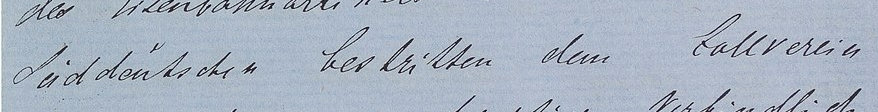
Süddeutschen bestritten dem Zollverein
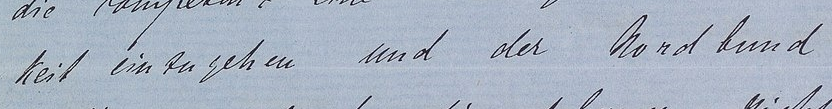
keit einzugehen und der Nordbund
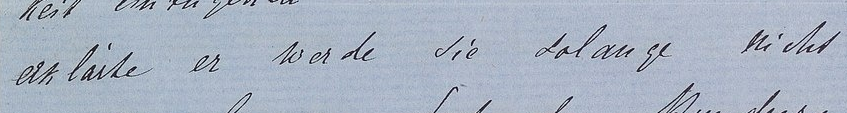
erklärte er werde sie solange nicht
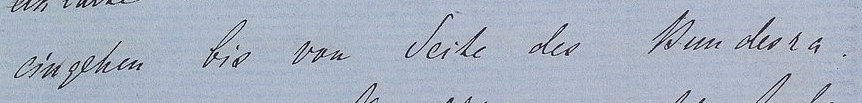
eingehen bis von Seite des Bundesra-
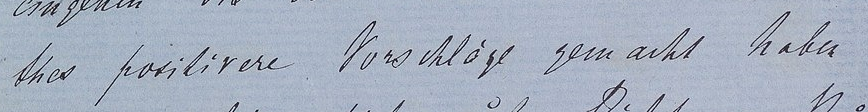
thes positivere Vorschläge gemacht haben
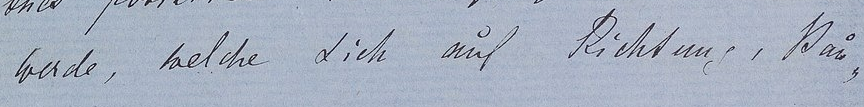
werde, welche sich auf Richtung, Bau-
